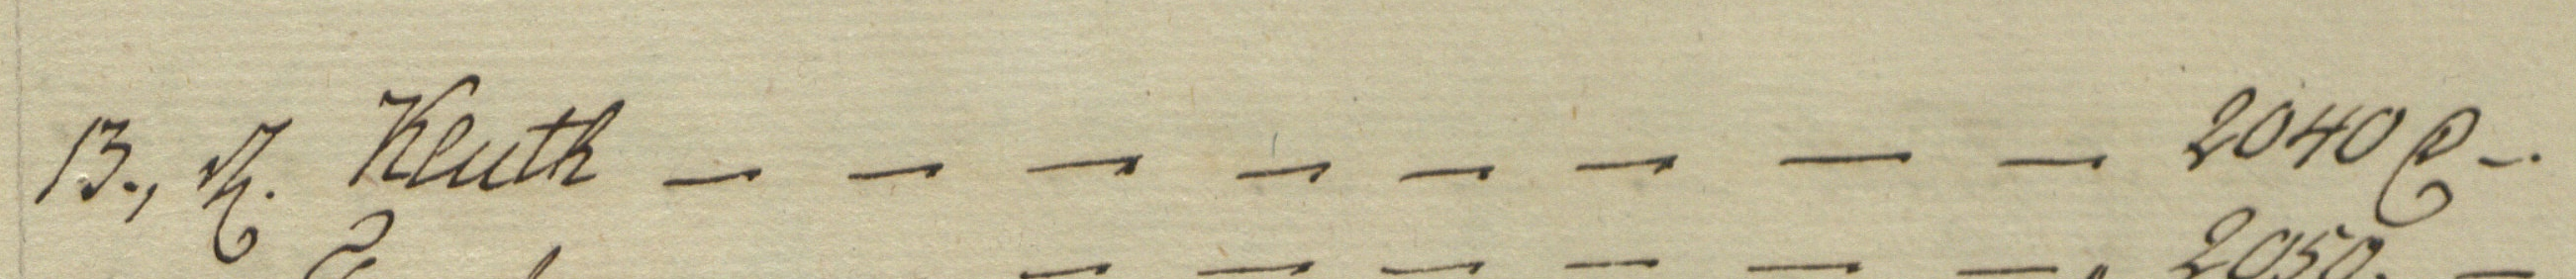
13., dh. Kluth 2040 l.
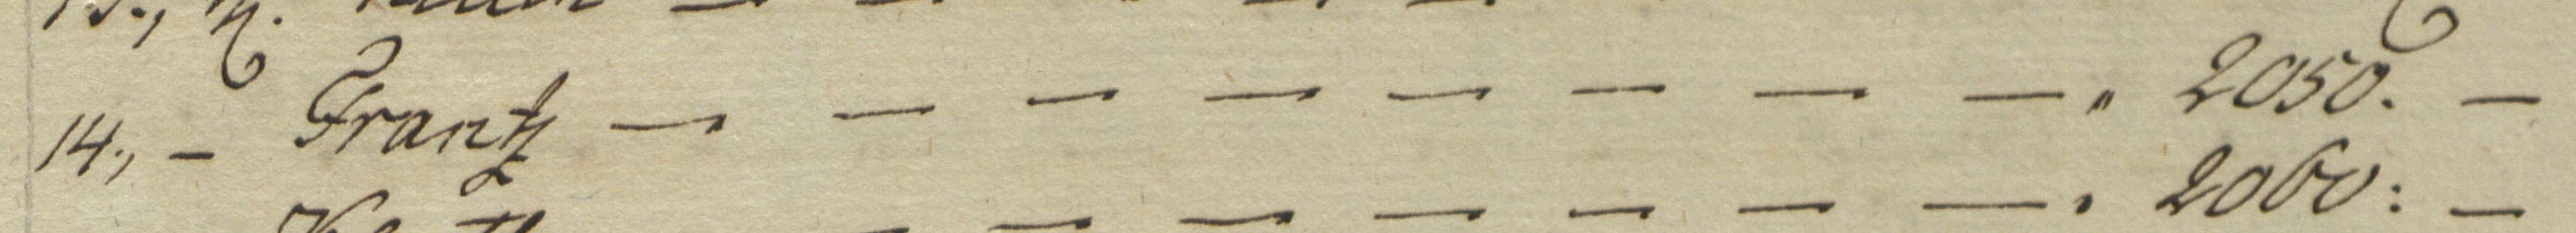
14., Frantz 2050:
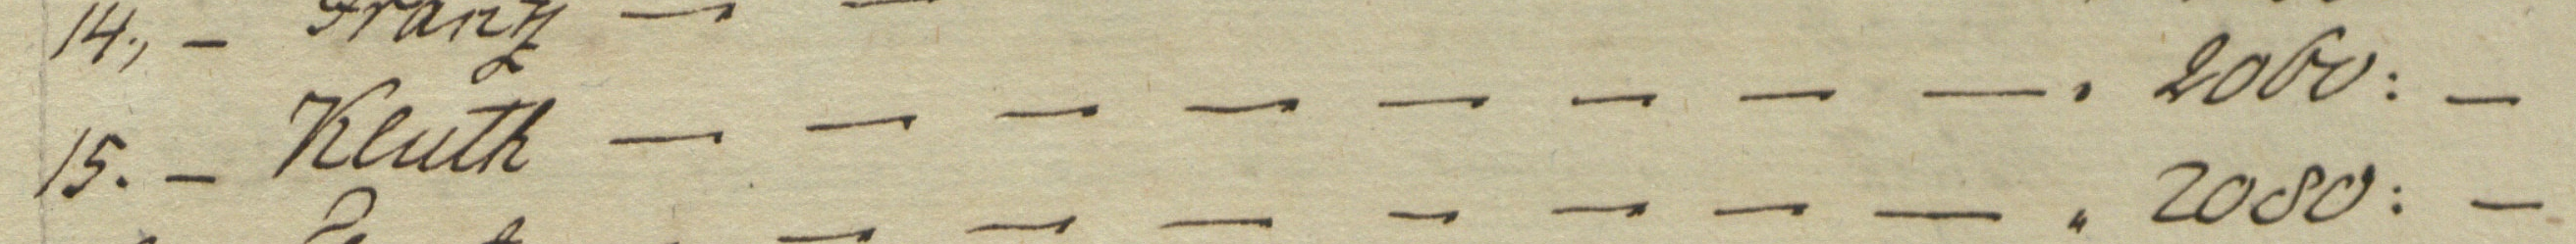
15. Kluth 2060:
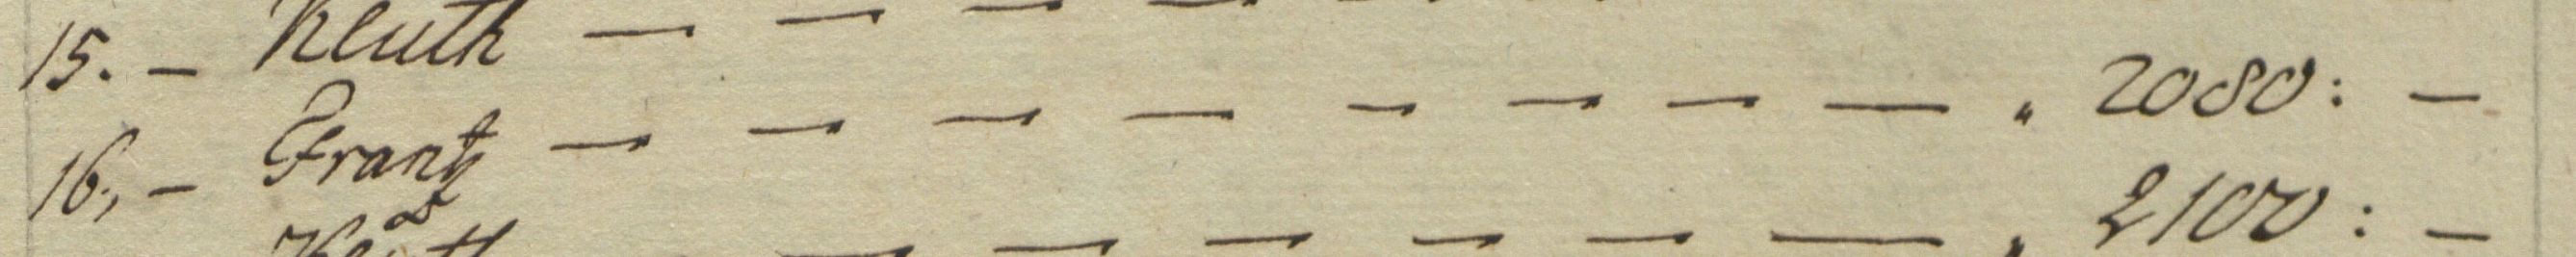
16., Frantz 2080:
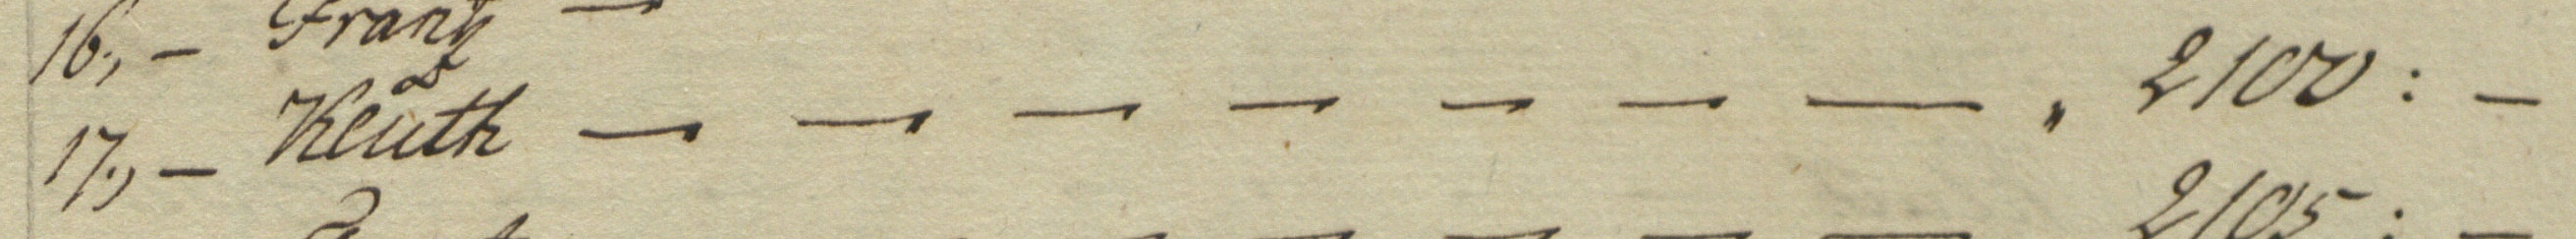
17., Kluth 2100:
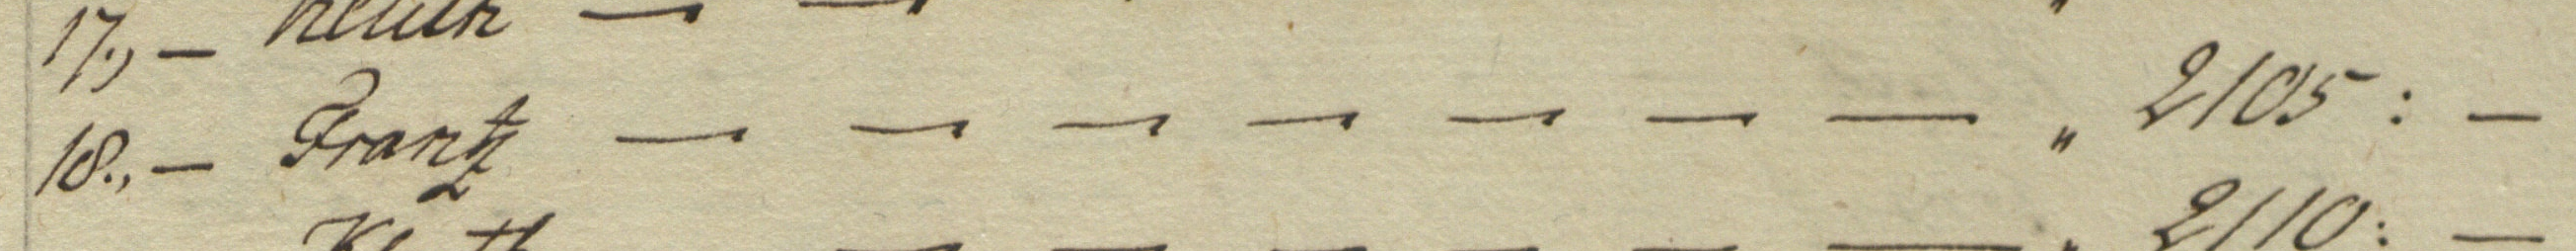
18., Frantz 2105:
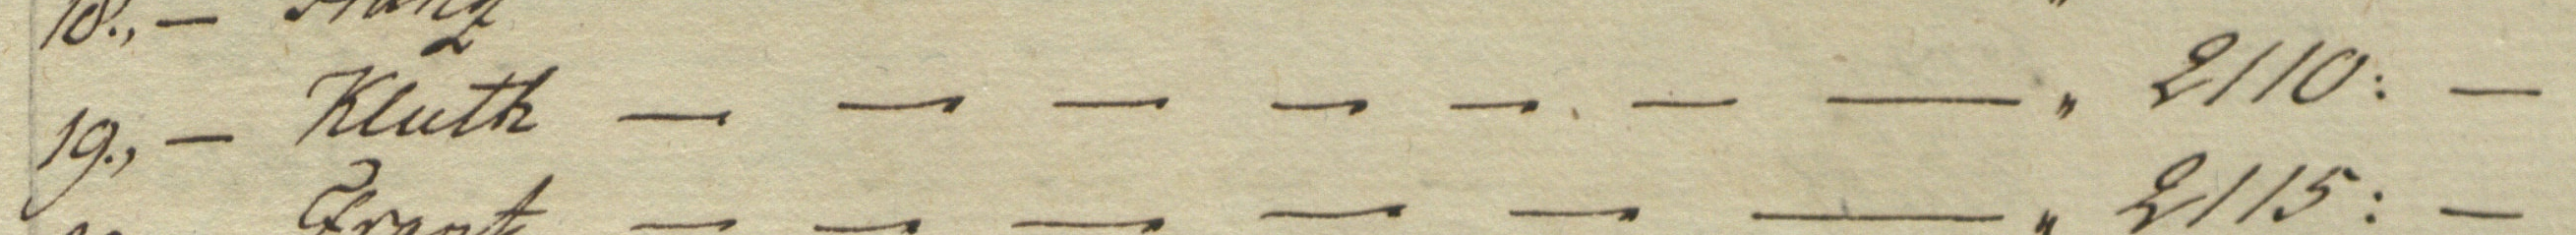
19., Kluth 2110:
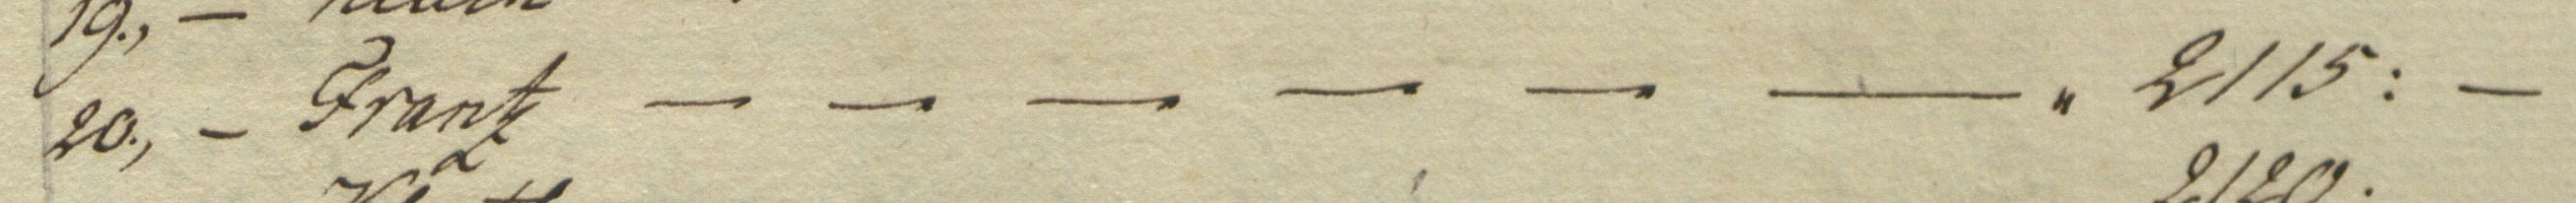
20., Frantz 2115:
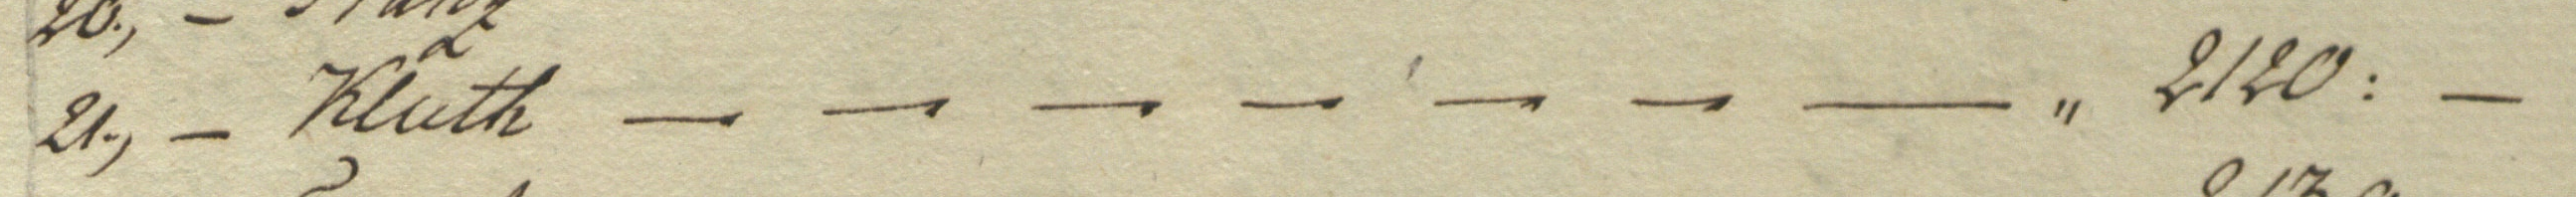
21., Kluth 2120:
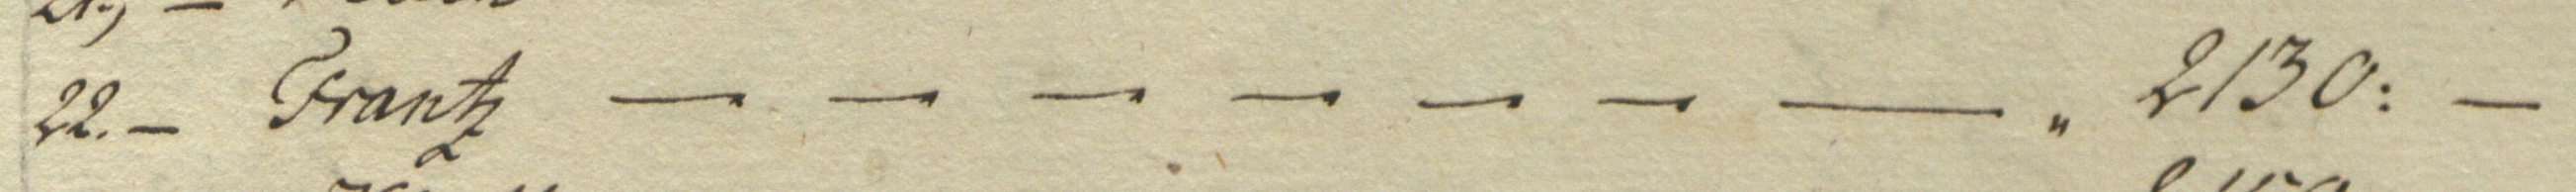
22. Frantz 2130:
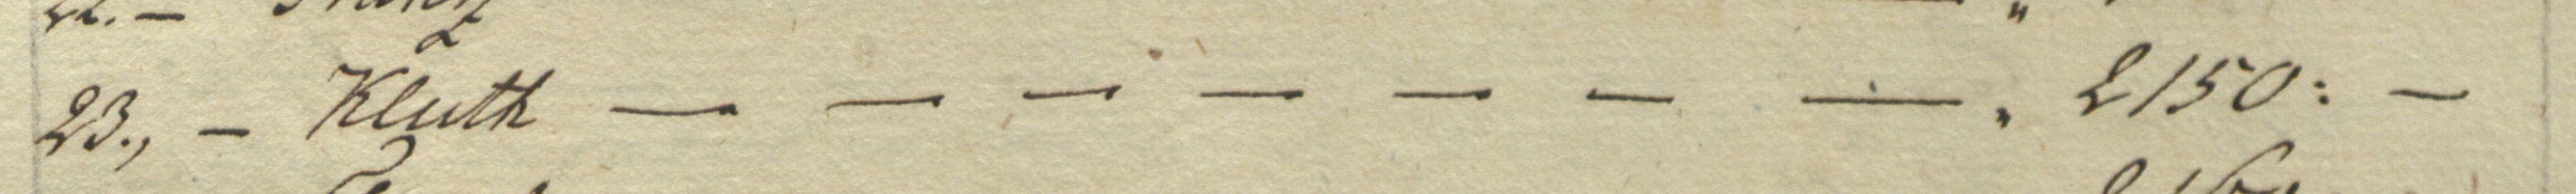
23., Kluth 2150.
